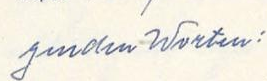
genden Worten
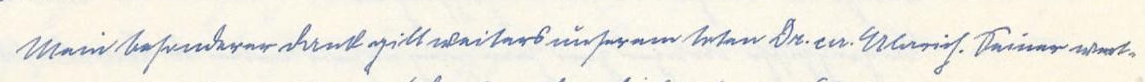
… Mein besonderer Dank gilt weiters unseren Toten Dr. cer. Alarich. Seiner wert-
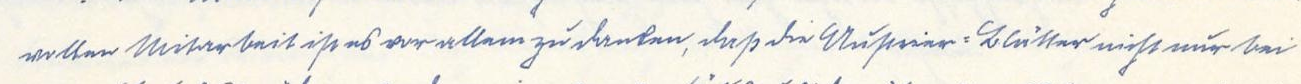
vollen Mitarbeit ist es vor allem zu danken, daß die Austrier-Blätter nicht nur bei
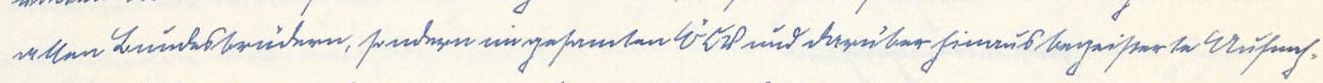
allen Bundesbrüdern, sondern im gesamten ÖCV und darüber hinaus begeisterte Aufnah-
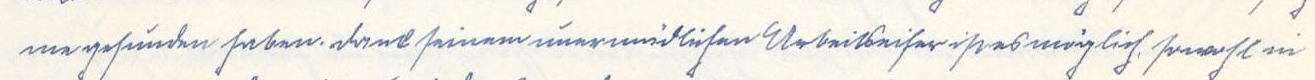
me gefunden haben. Dank seinem unermüdlichen Arbeitseifer ist es möglich, sowohl in
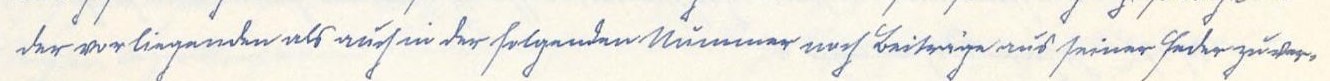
der vorliegenden als auch in der folgenden Nummer noch Beiträge aus seiner Feder zu ver-
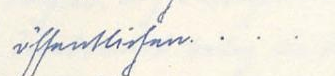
öffentlichen. …
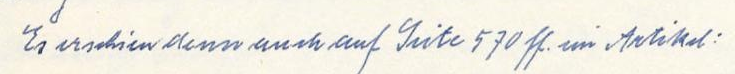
Es erschien denn auch auf Seite 570 ff. ein Artikel:
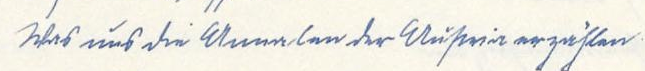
Was uns die Annalen der aus der Austria erzählen
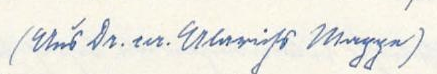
(Aus Dr. cer. Alarichs Mappe)
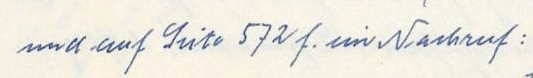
und auf Seite 572 f. ein Nachruf:
